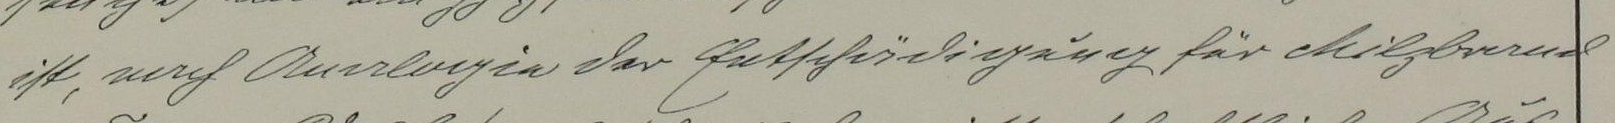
ist, nach Analogie der Entschädigung für Milzbrand
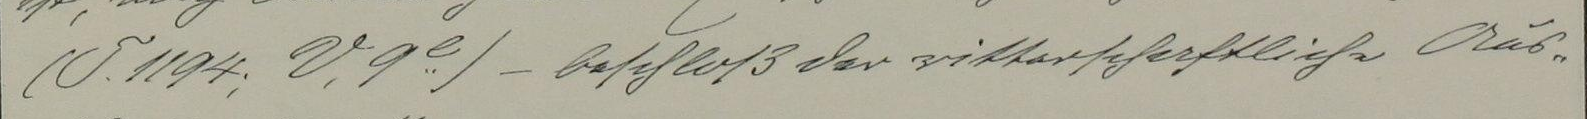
(T.1194; V.9e) - beschloß der ritterschaftliche Aus-
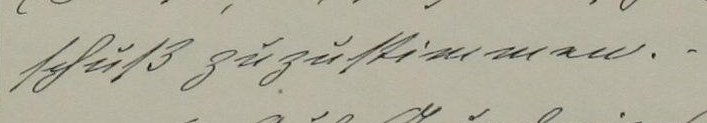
schuß zuzustimmen.
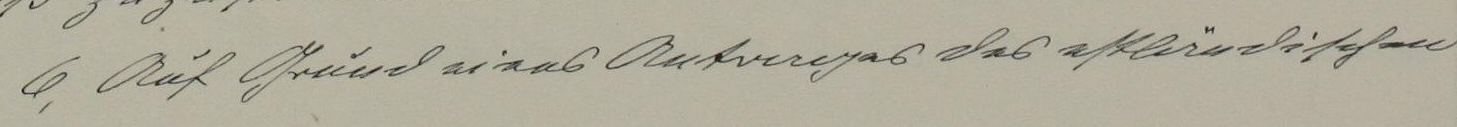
6. Auf Grund eines Antrages des estländischen
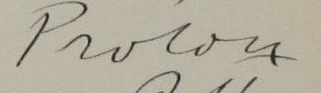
Protok
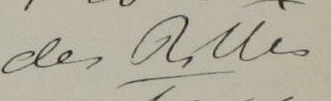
des Ritter
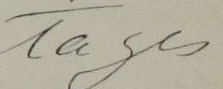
tages
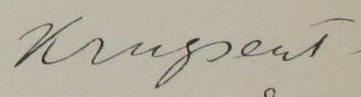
Krugsent
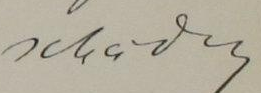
schädigung
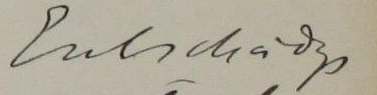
Entschädigungs
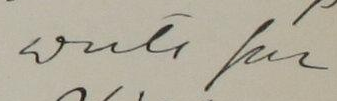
wete für
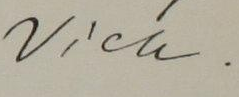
Vieh
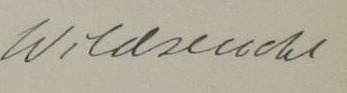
Wildseuche
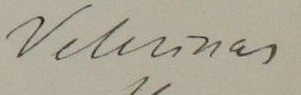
Veterinär
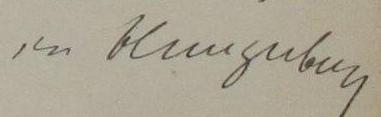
in Hungerburg
